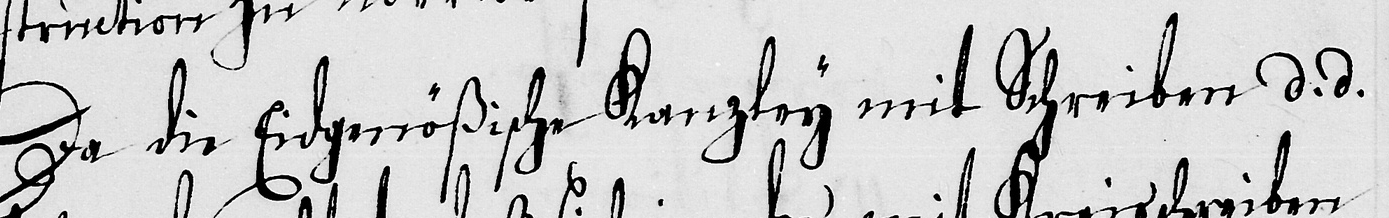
Da die Eidgenößische Kanzley mit Schreiben d. d.
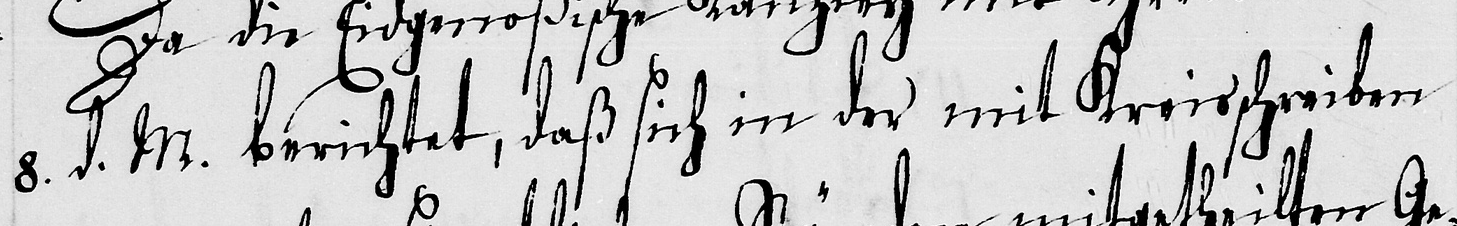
8. d. M berichtet, daß sich in der mit Kreisschreiben
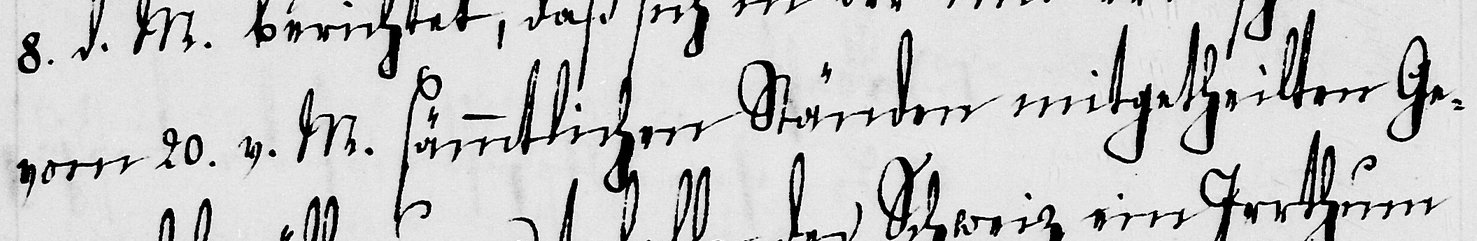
vom 20. v. M. sämmtlichen Ständen mitgetheilten Ge¬
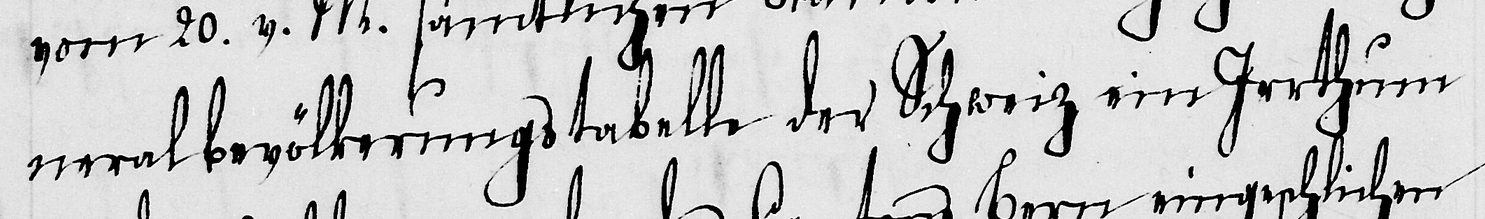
neralbevölkerungstabelle der Schweiz ein Irrthum
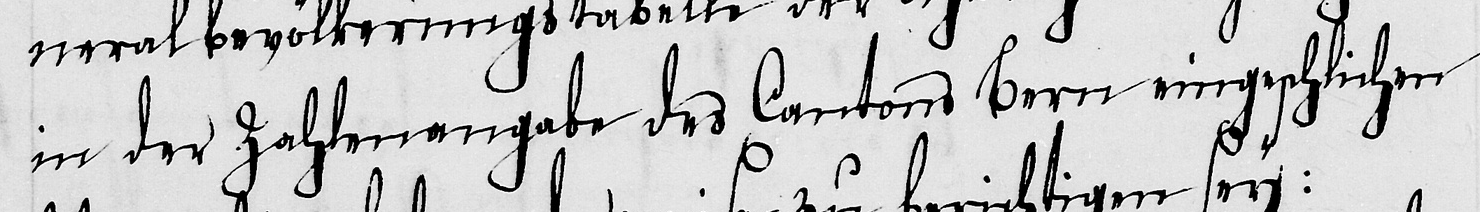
in der Zahlenangabe des Cantons Bern eingeschlichen
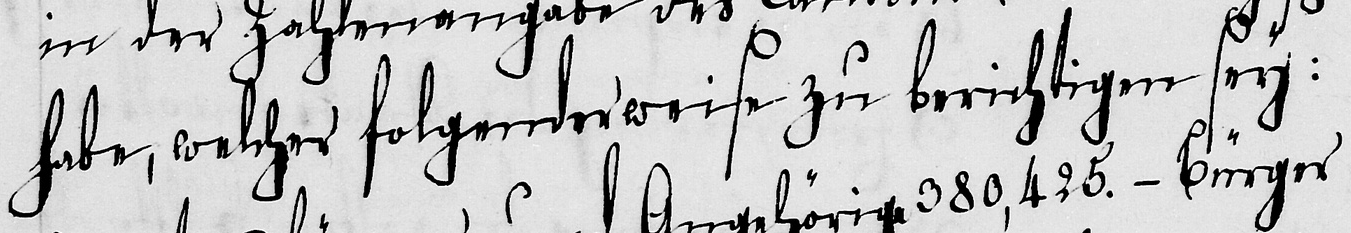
habe, welcher folgenderweise zu berichtigen sey:
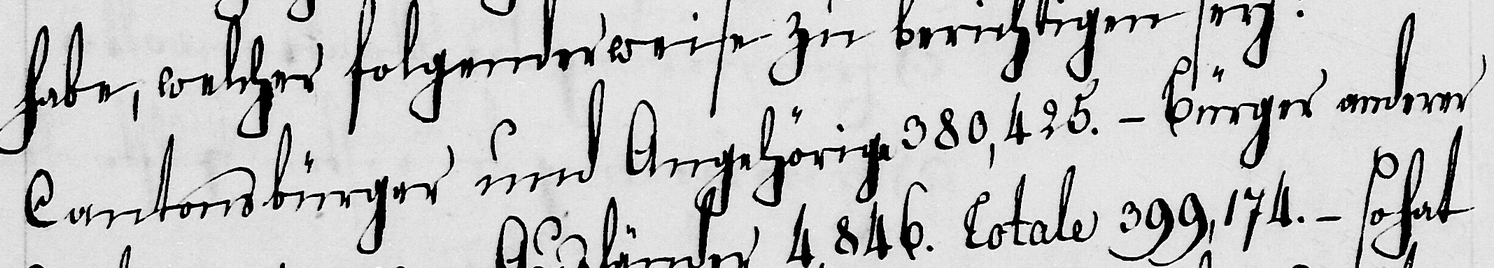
Cantonsbürger und Angehörige 380,425. – Bürger anderer
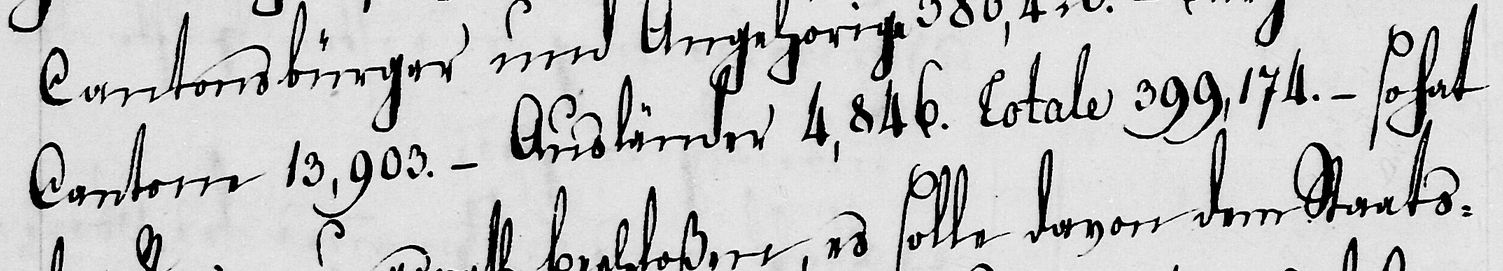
Cantone 13,903. – Ausländer 4,846. Totale 399,174. – so hat
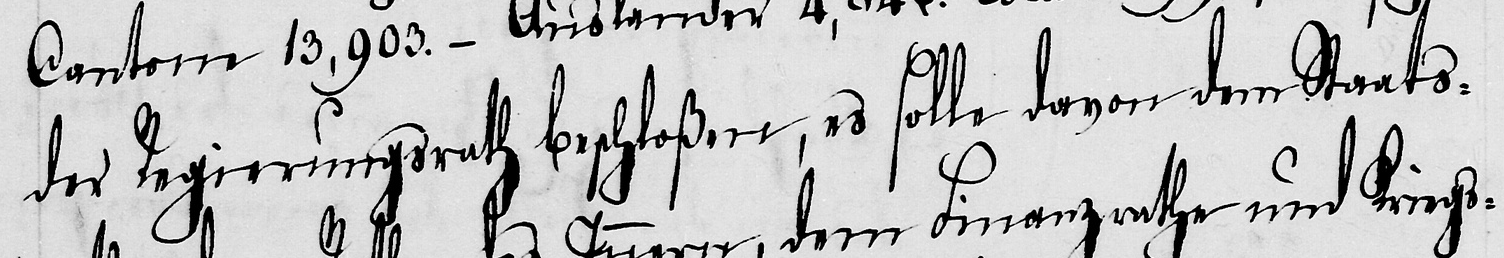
der Regierungsrath beschloßen, es solle davon dem Staats¬
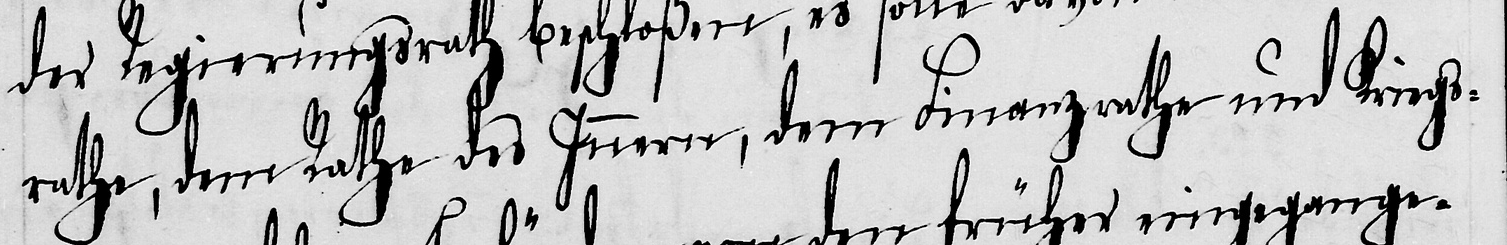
rathe, dem Rathe des Innern, dem Finanzrathe und Kriegs¬
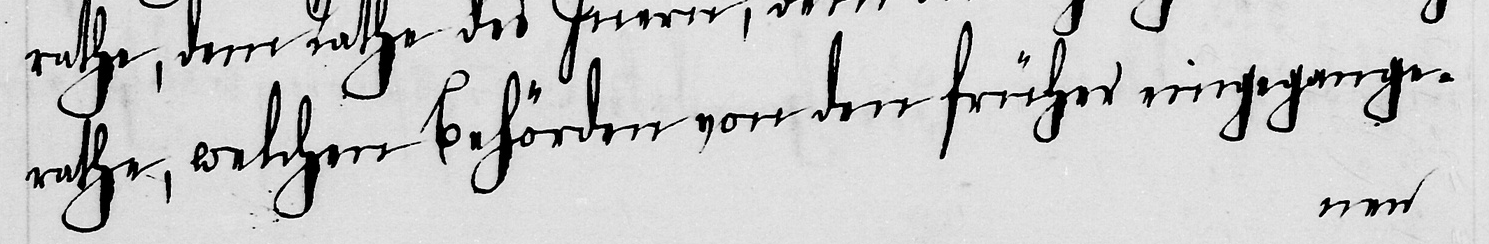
rathe, welchen Behörden von den früher eingegange-
